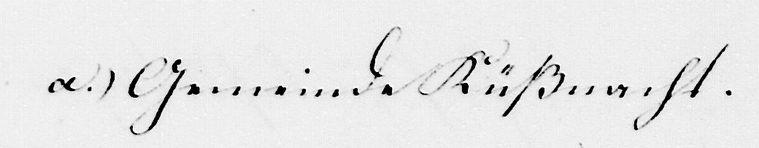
a.) Gemeinde Küßnacht.
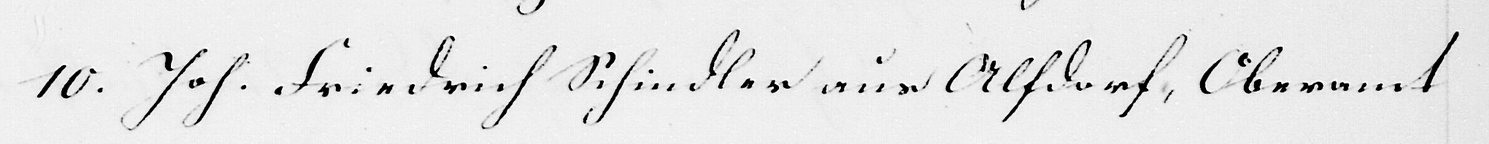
10. Joh. Friedrich Schindler aus Alfdorf, Oberamt
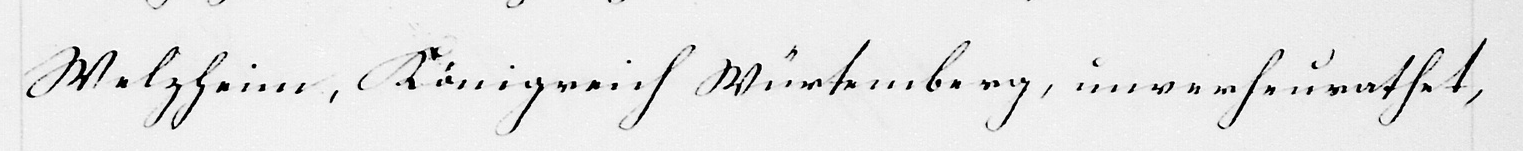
Welzheim, Königreich Würtemberg, unverheurathet,
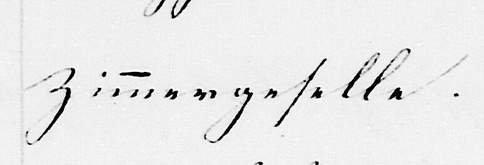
Zimmergeselle.
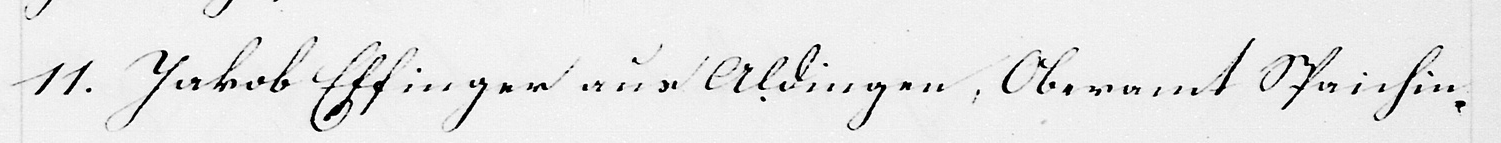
11. Jakob Effinger aus Aldingen, Oberamt Spaichin¬
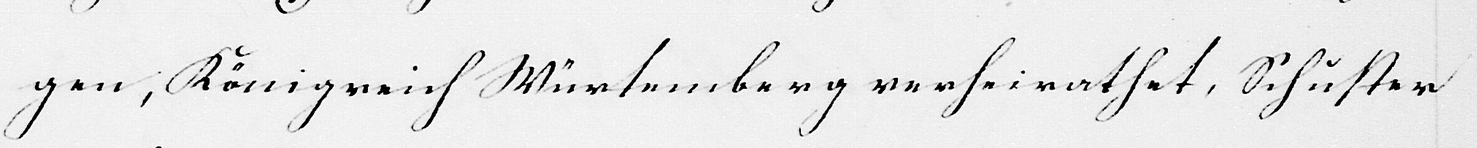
gen, Königreich Würtemberg verheirathet, Schuster
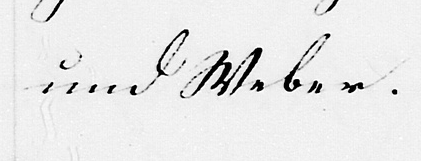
und Weber.
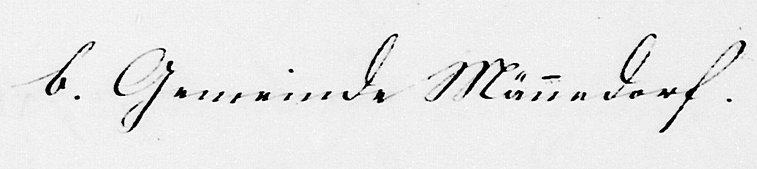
b. Gemeinde Männedorf.
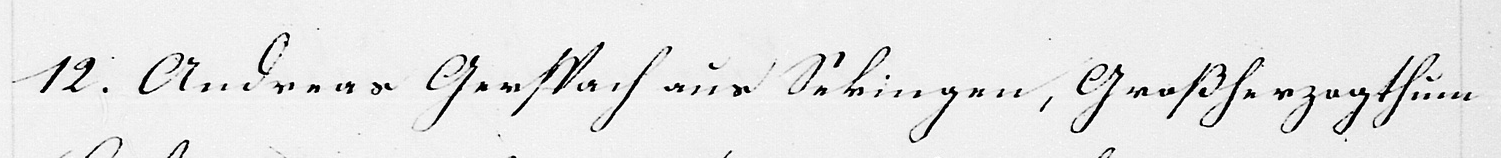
12. Andreas Gerspach aus Sekingen, Großherzogthum
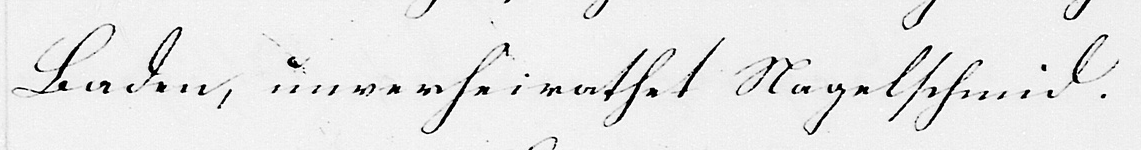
Baden, unverheirathet Nagelschmid.
